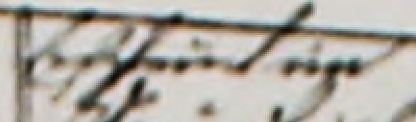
Esseint im
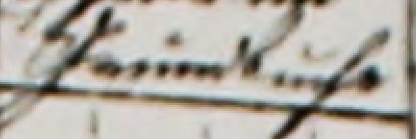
Grundbuche
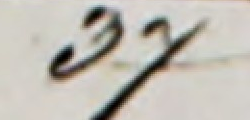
37
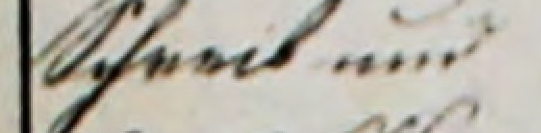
Schreib und
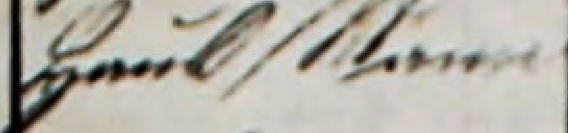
Haus Name
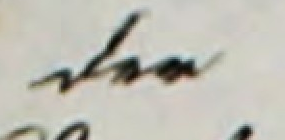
der
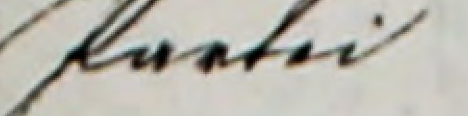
Partei.
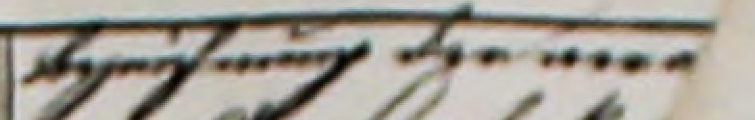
Bezeichnung der erarischen
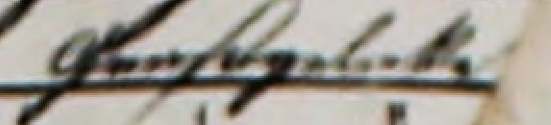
Graßgelake
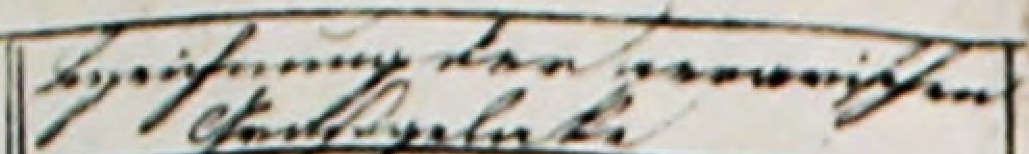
Bezeichnung der erarischen
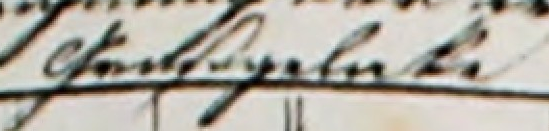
Graßgelake
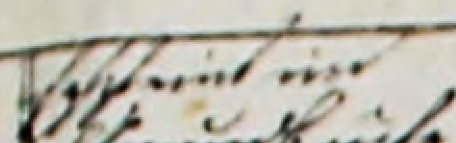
Esseint im
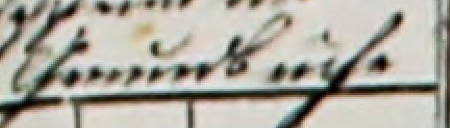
Grundbuche
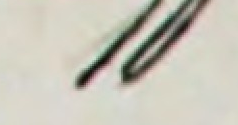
10
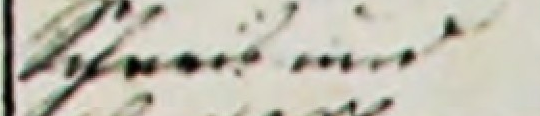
Schreib und
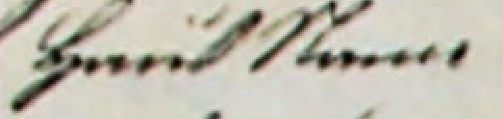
Haus Name
